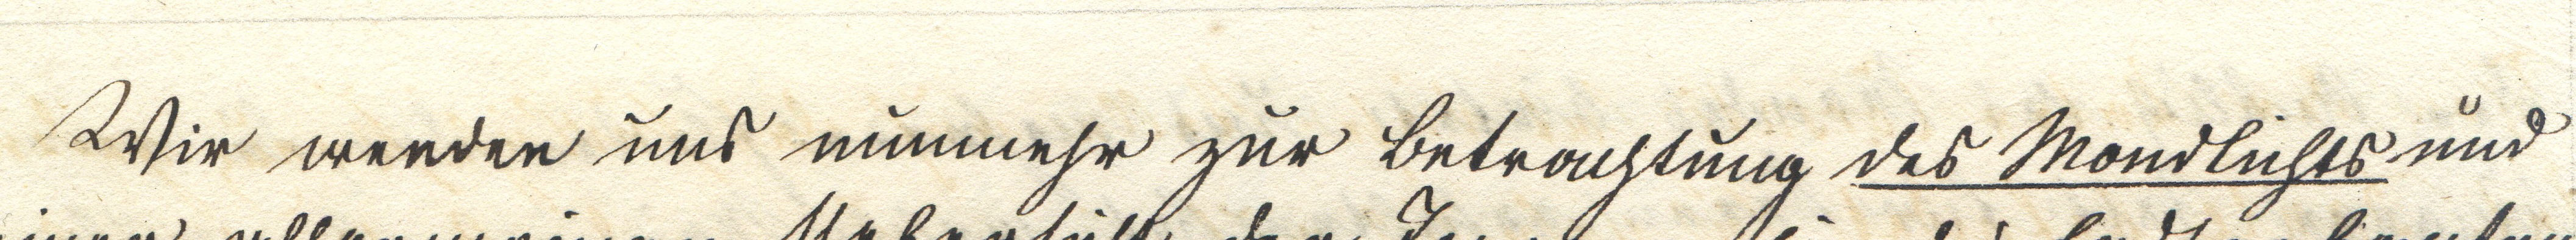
Wir wenden uns nunmehr zur Betrachtung des Mondlichts und
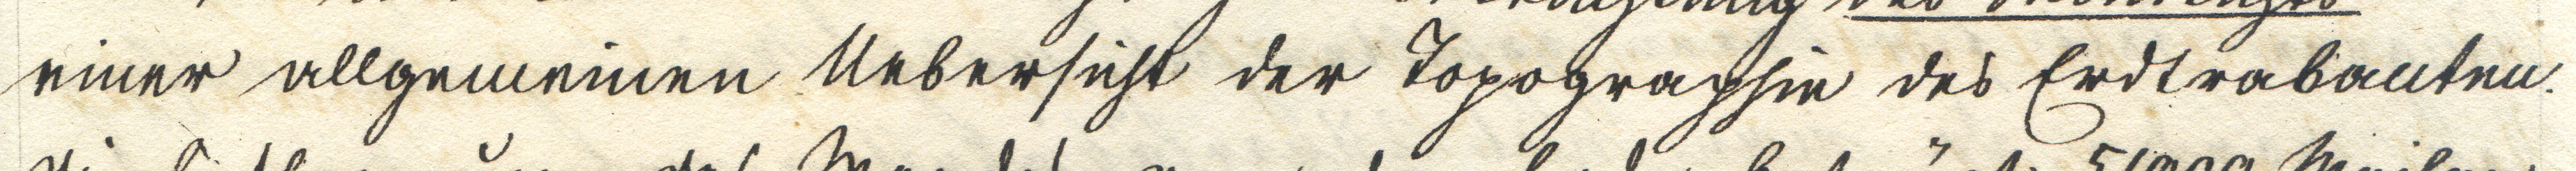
einer allgemeinen Uebersicht der Topographie des Erdtrabanten.
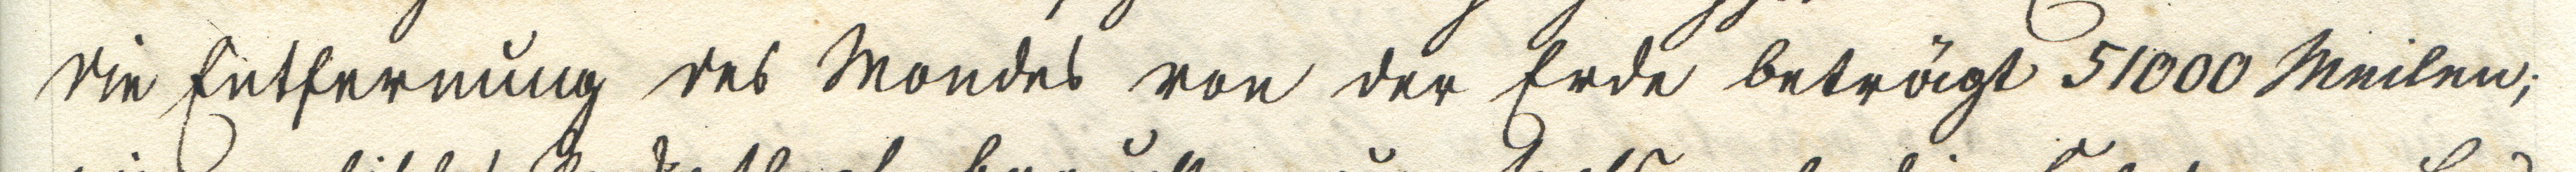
Die Entfernung des Mondes von der Erde beträgt 51000 Meilen;
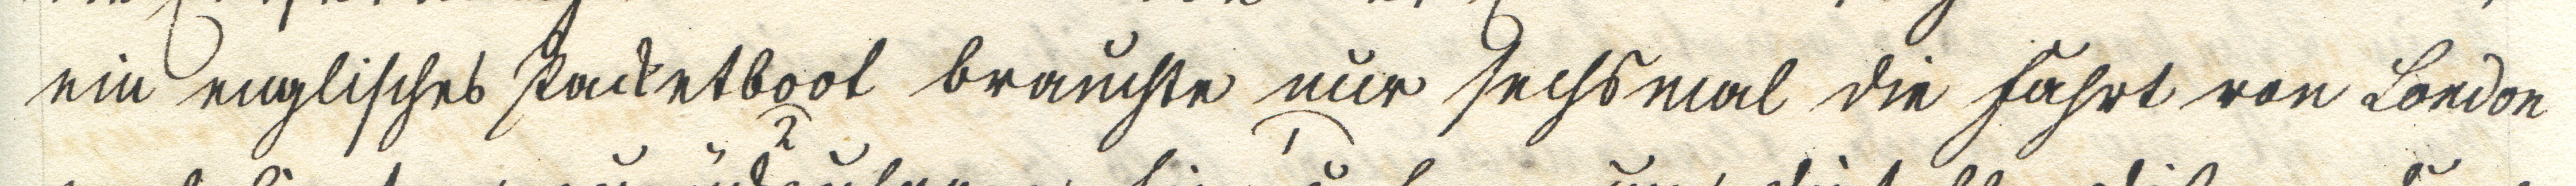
ein englisches Packetboot brauchte nur sechs mal die Fahrt von London
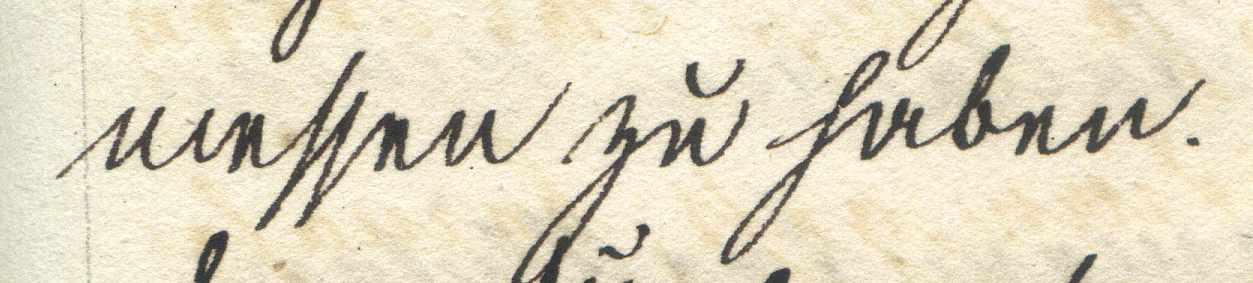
messen zu haben.
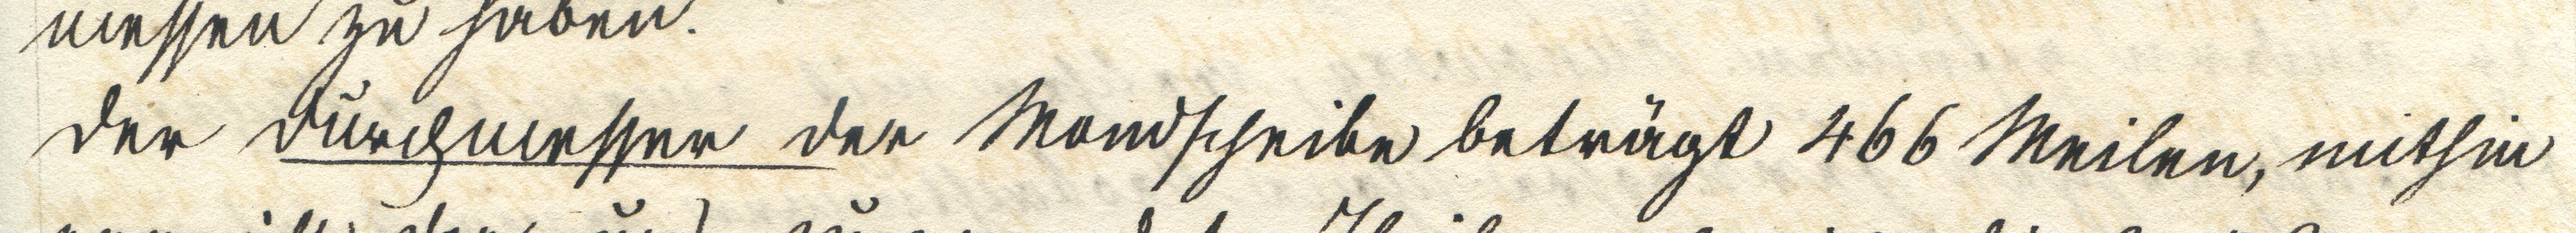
Der Durchmesser der Mondscheibe beträgt 466 Meilen, mithin
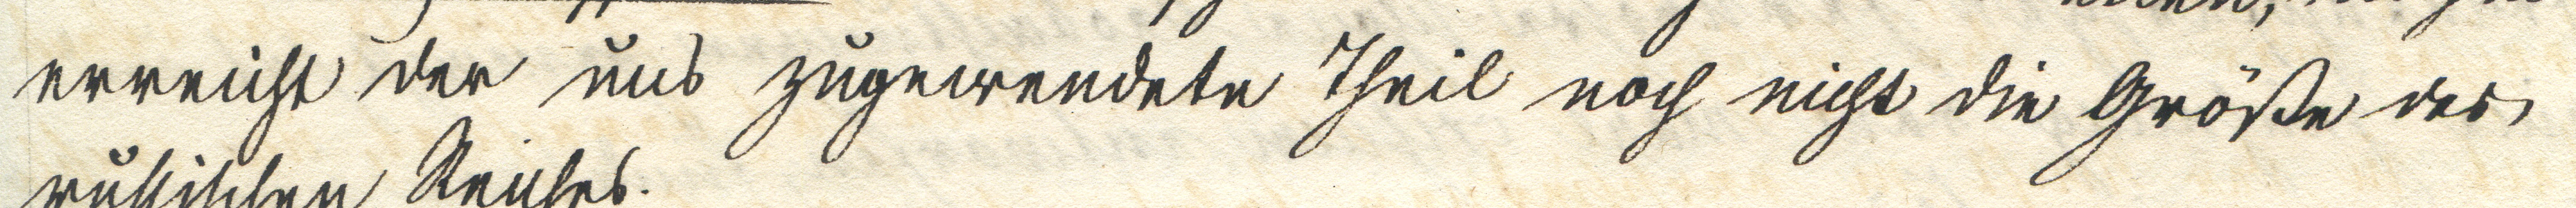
erreicht der uns zugewendete Theil noch nicht die Größe des
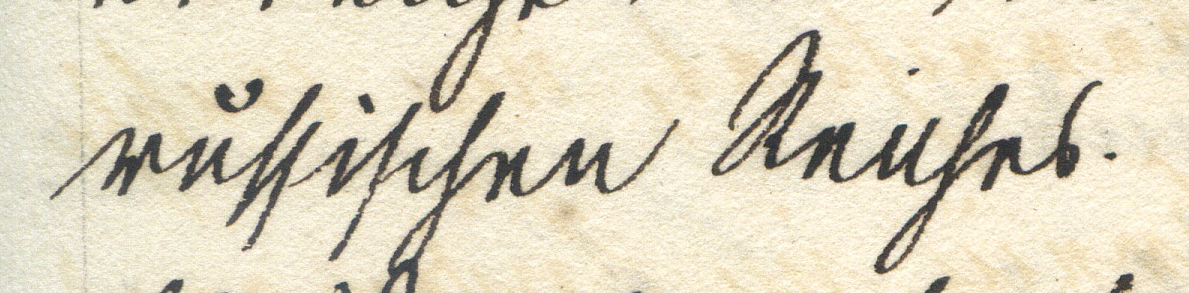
russischen Reiches.
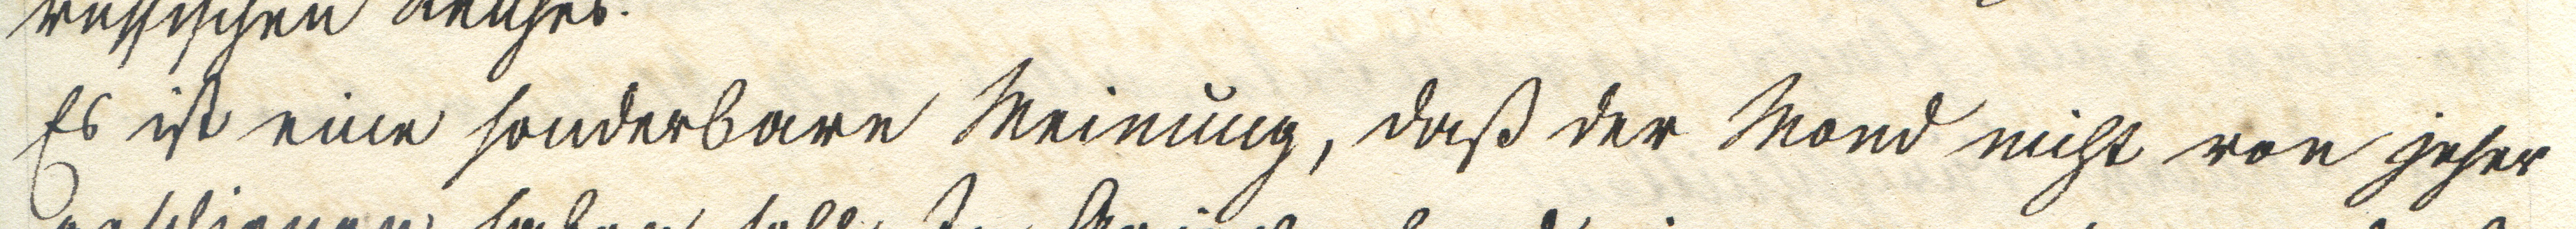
Es ist eine sonderbare Meinung, daß der Mond nicht von jeher
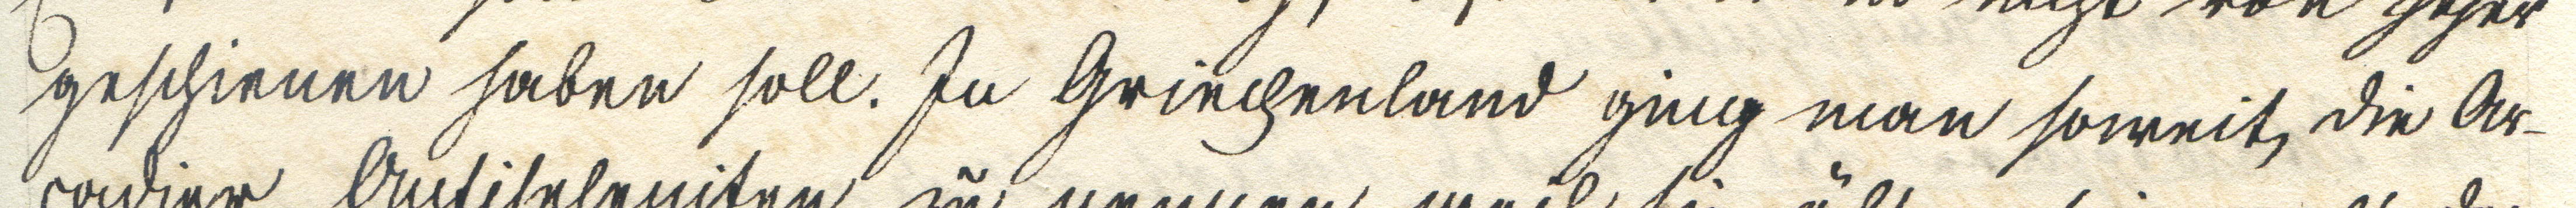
geschienen haben soll. In Griechenland ging man soweit die, Ar-
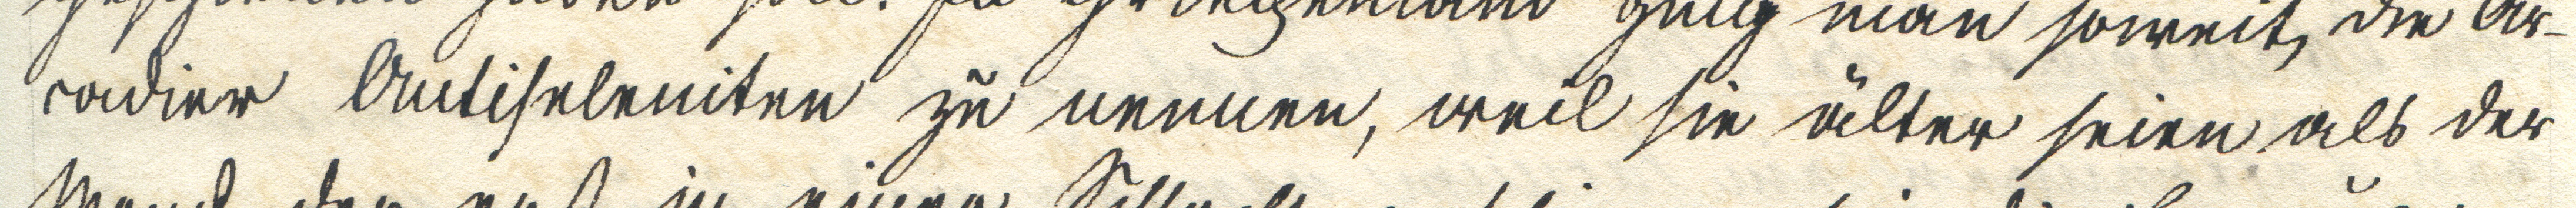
cadier Antiseleniten zu nennen, weil sie älter seien als der
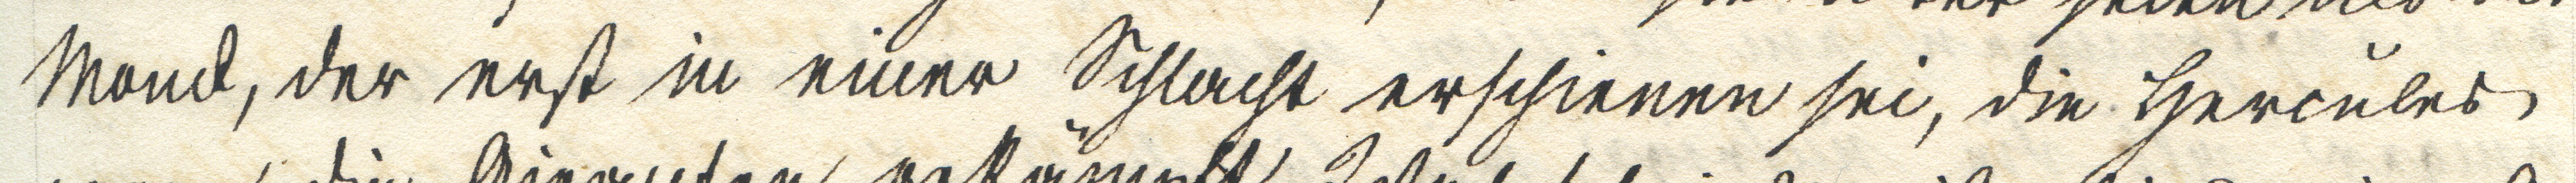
Mond, der erst in einer Schlacht erschienen sei, die Hercules
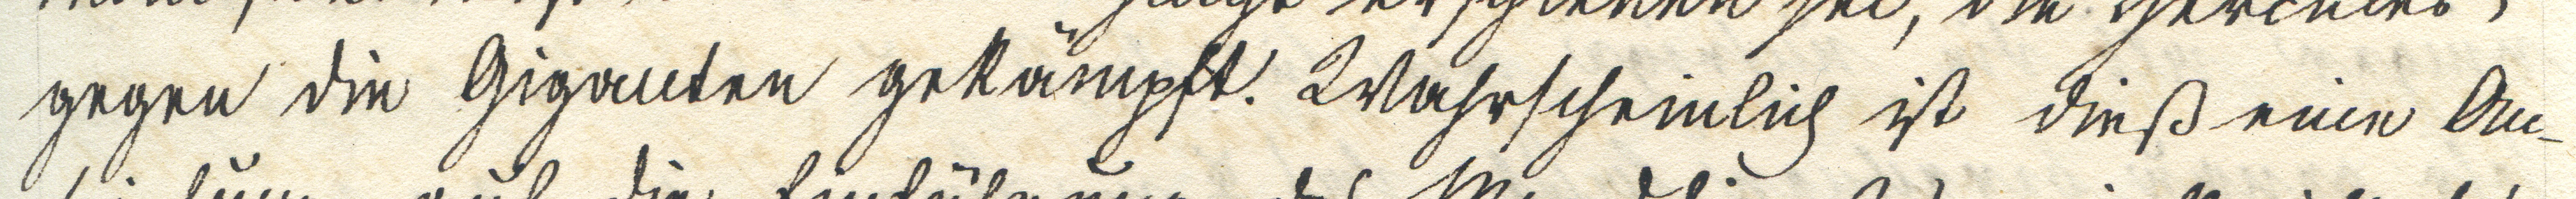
gegen die Giganten gekämpft. Wahrscheinlich ist dieß eine An-
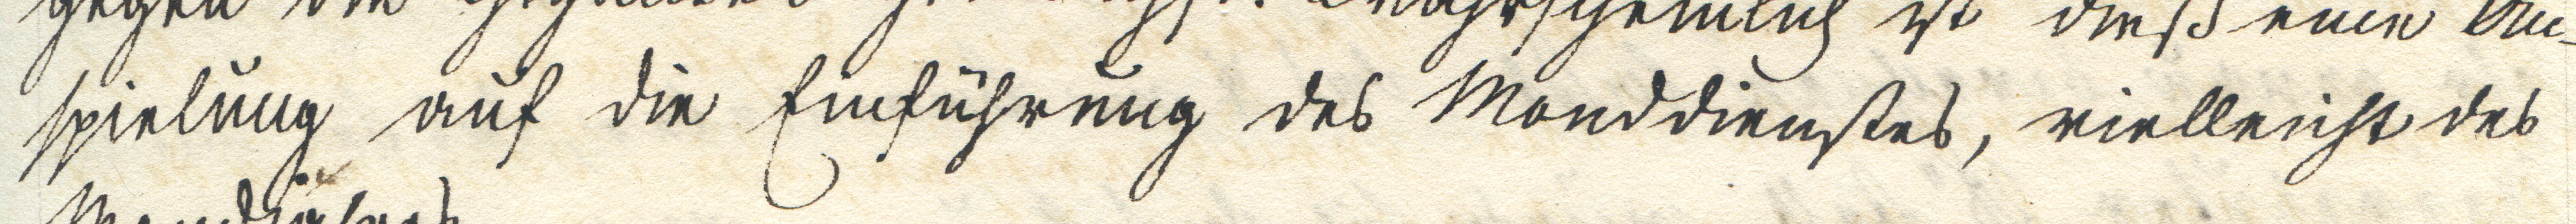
spielung auf die Einführung des Monddienstes, vielleicht des
